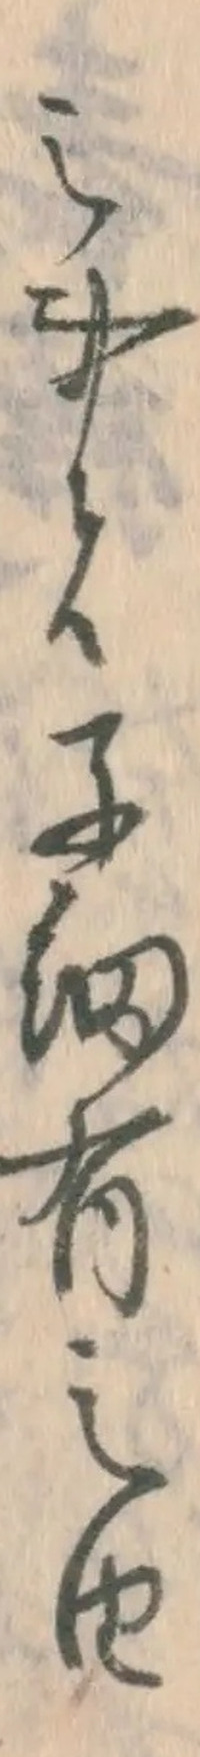之事ニ候子細有之由
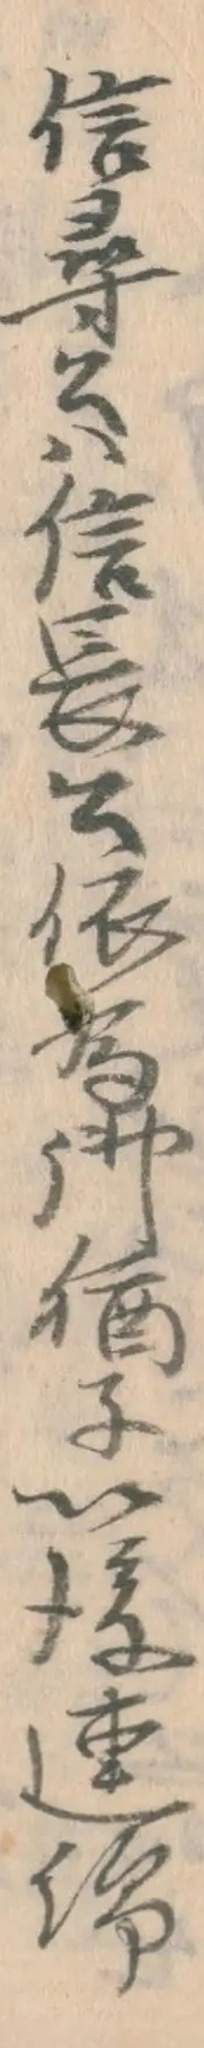信尋公ハ信長公依為御猶子以後連綿
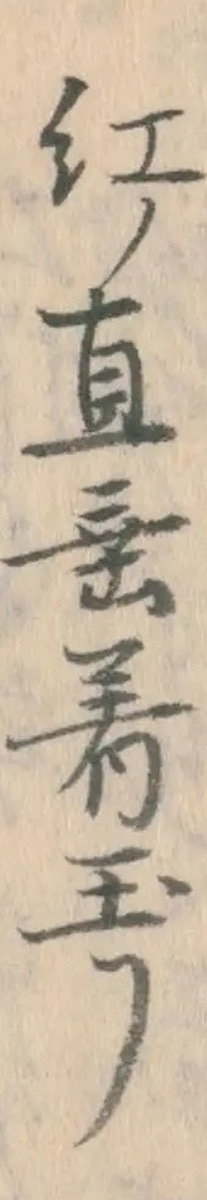紅ノ直垂着玉フ
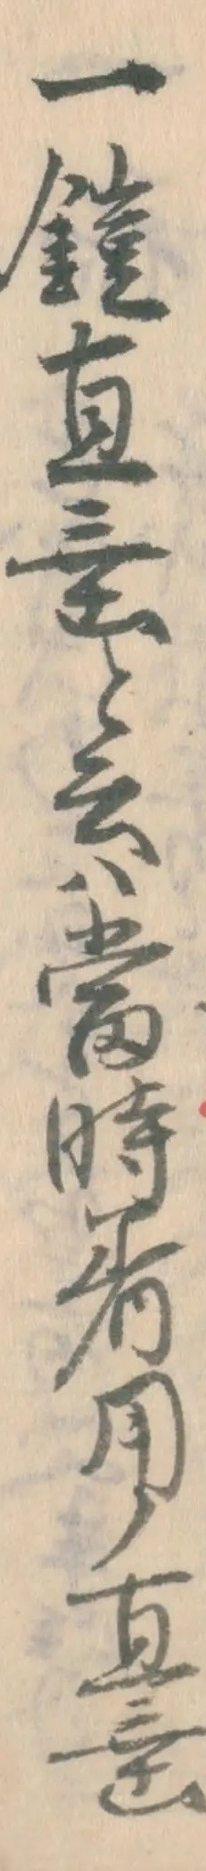一鎧直垂と云ハ当時着用ノ直垂
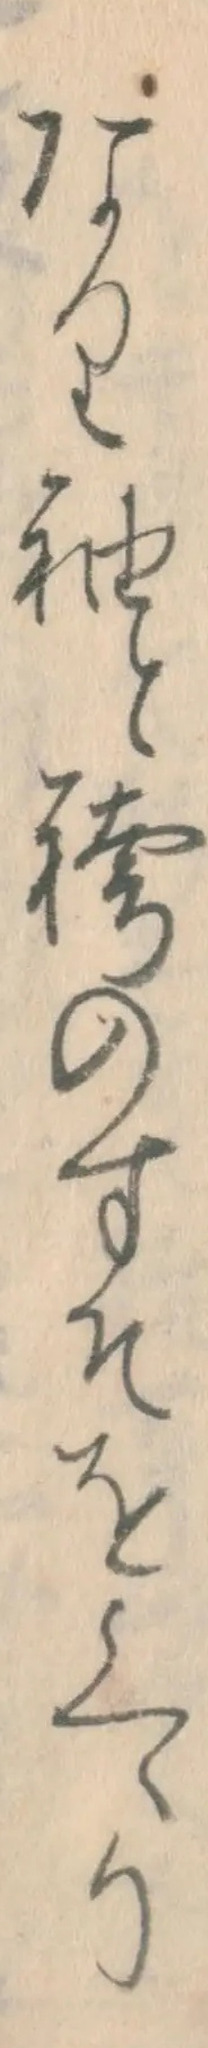なり袖と袴のすそをくゝり
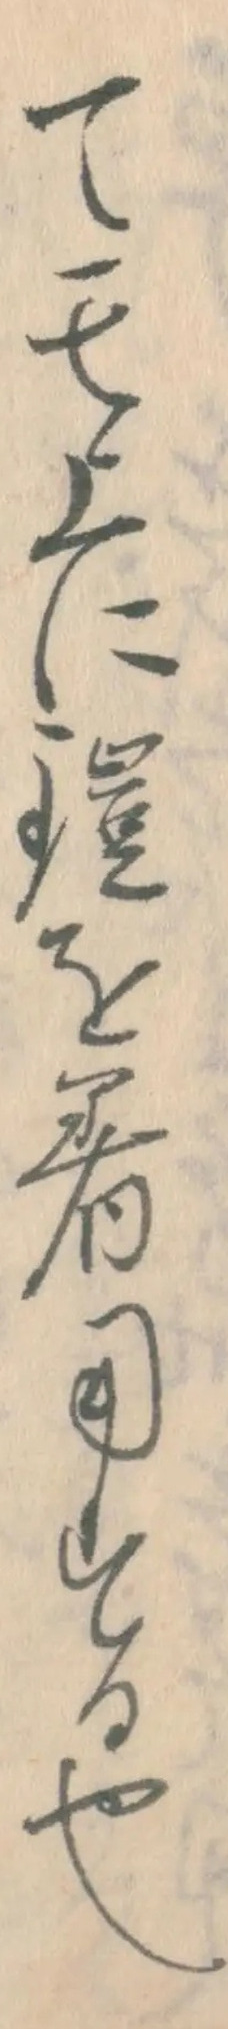て其上に鎧を着用する也
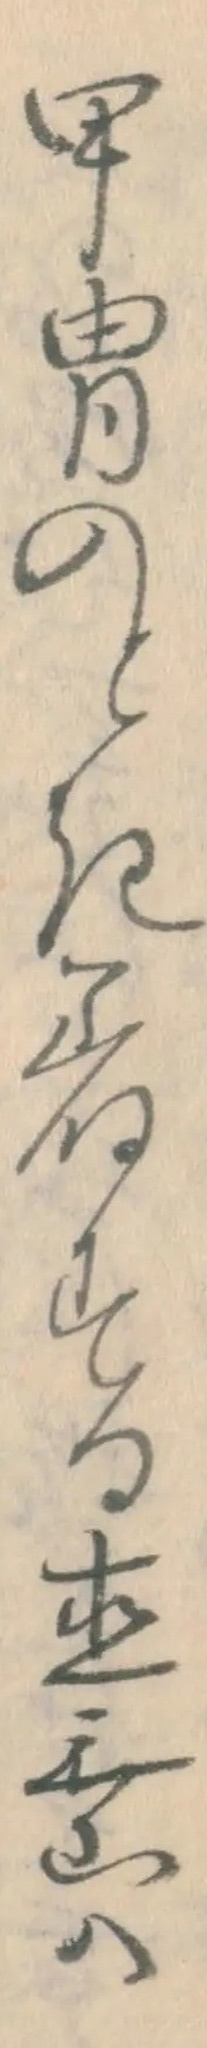甲冑のとき着する直垂ハ
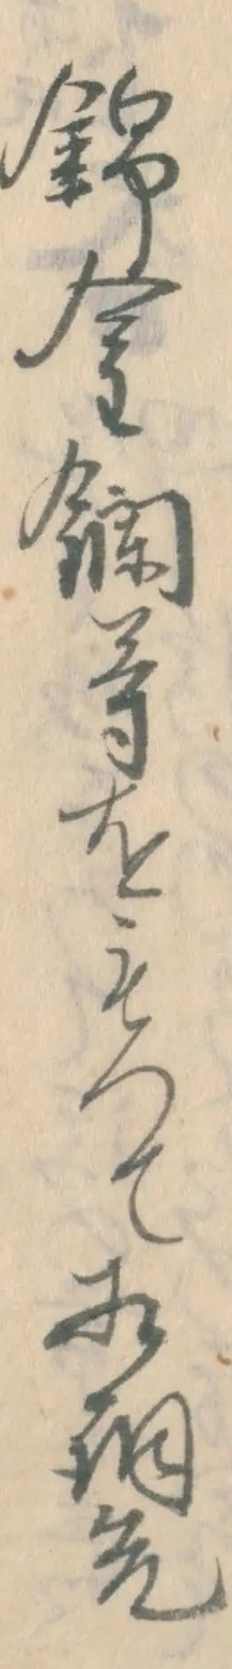錦金襴等をもつて相調先
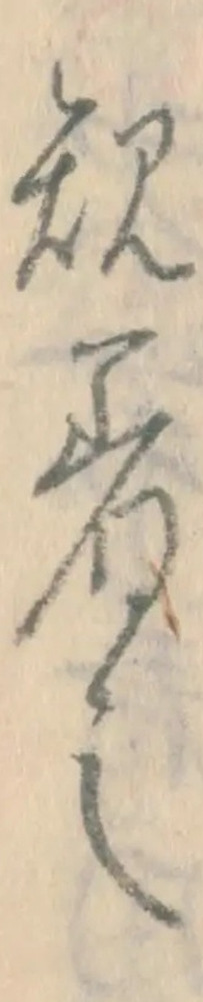規着之

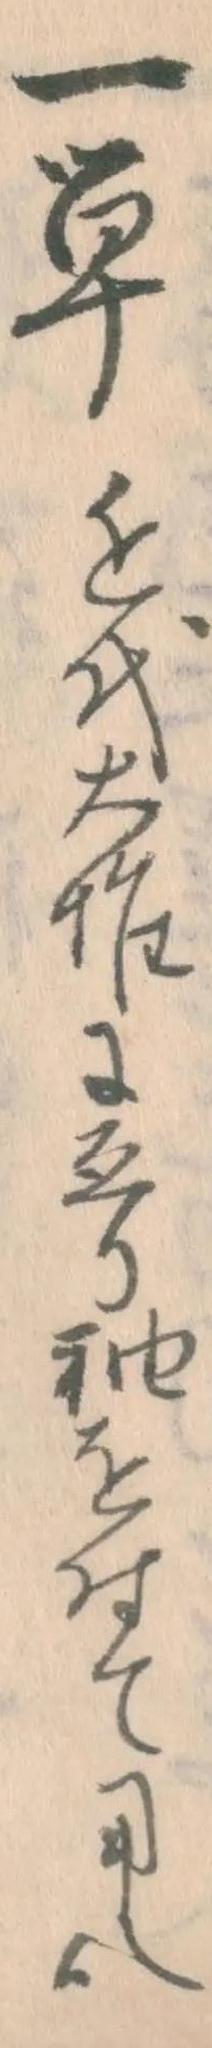一単近代大帷にゑり袖を付て用之候
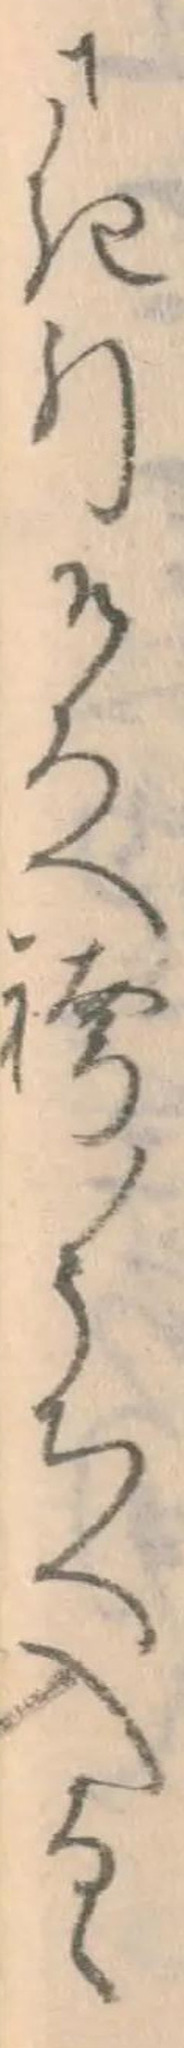さき引そろへ袴ノうちへ入るゝ
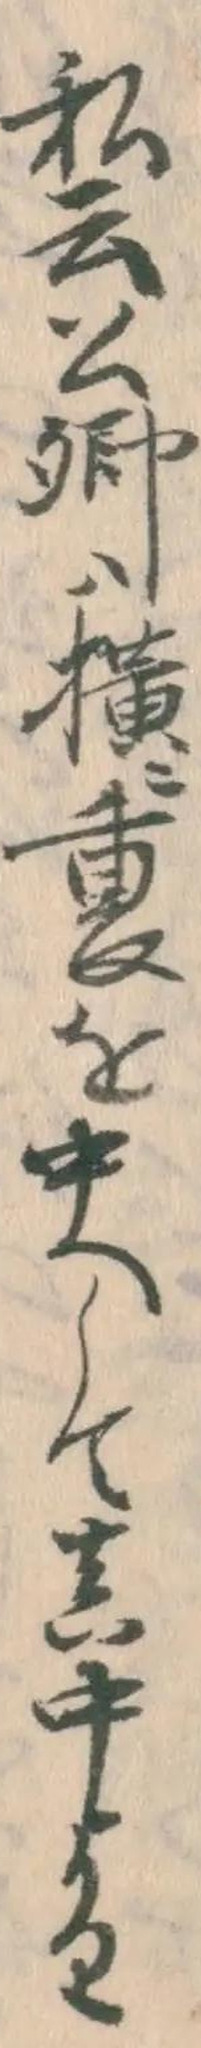私云公卿ハ横ニ裏を中へして真中より
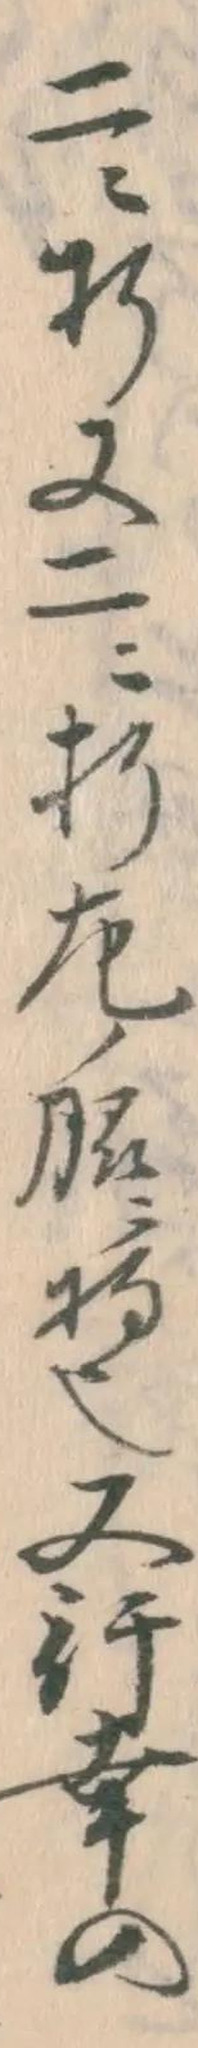二ニ折又二ニ折左ノ脇ニ持也又行幸の
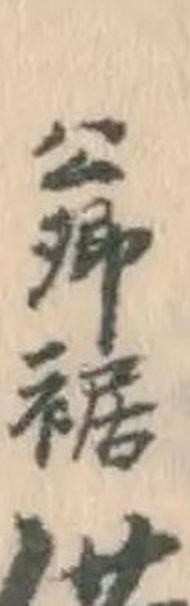公卿裾
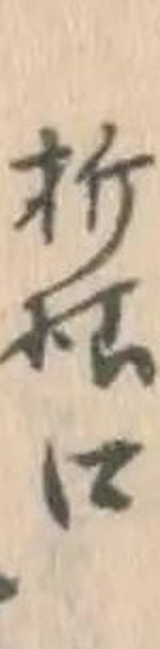折様口
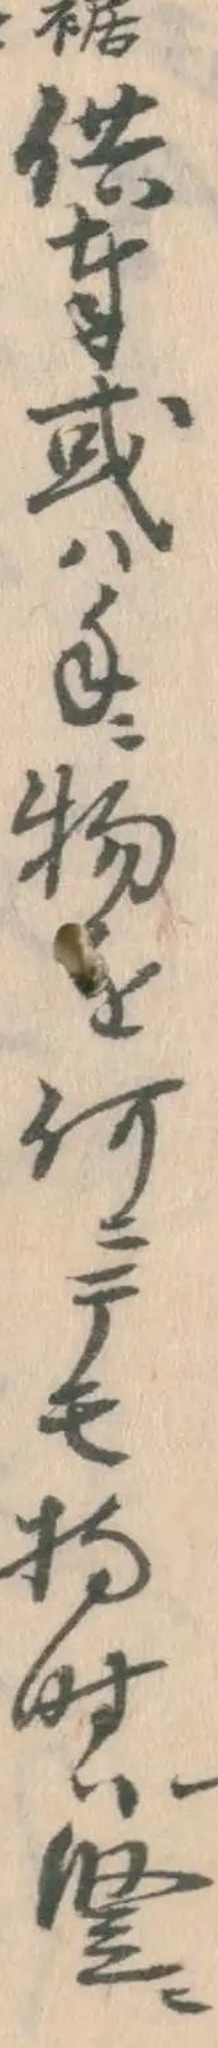供奉或ハ手に物を何ニテモ持時ハ竪ニ
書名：賀茂社記録. 第80冊
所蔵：国立国会図書館 National Diet Library, JAPAN
